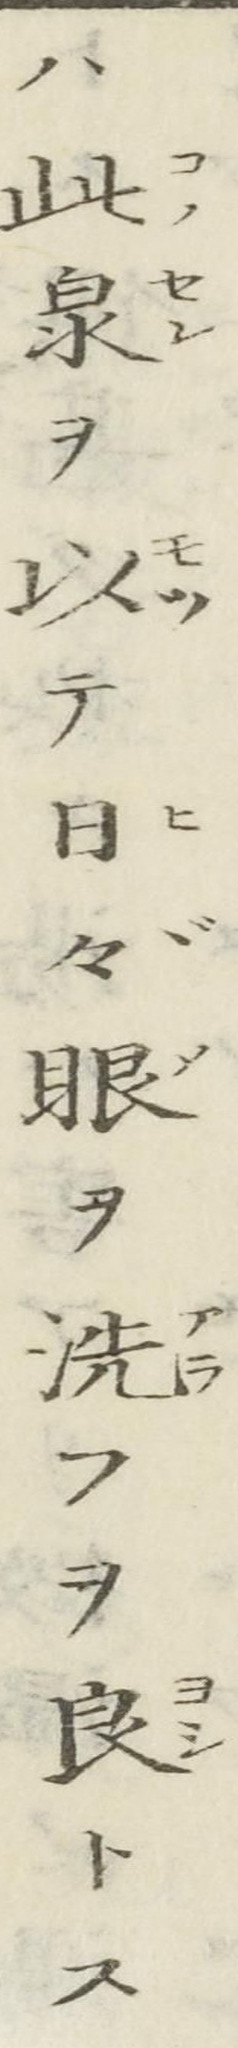ハ此泉ヲ以テ日々眼ヲ洗フヲ良トス
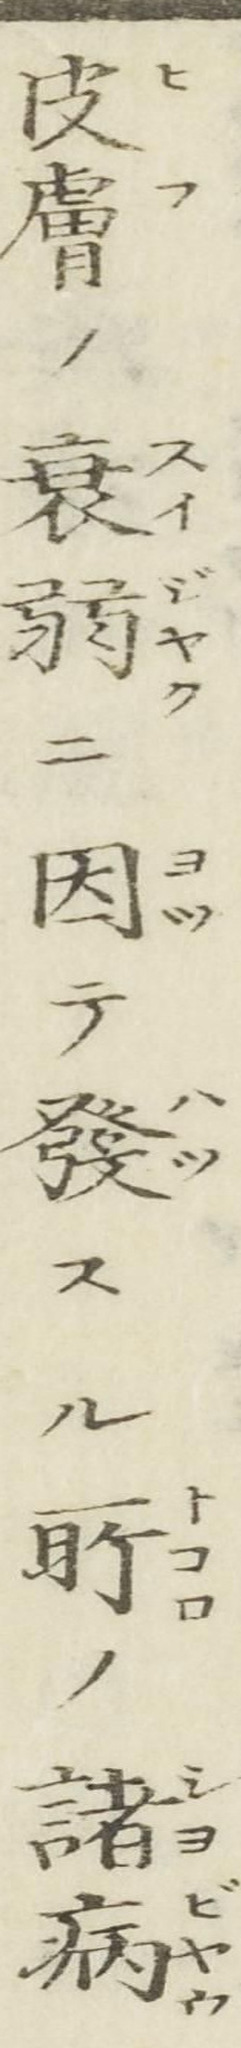皮膚ノ衰弱ニ因テ発スル所ノ諸病
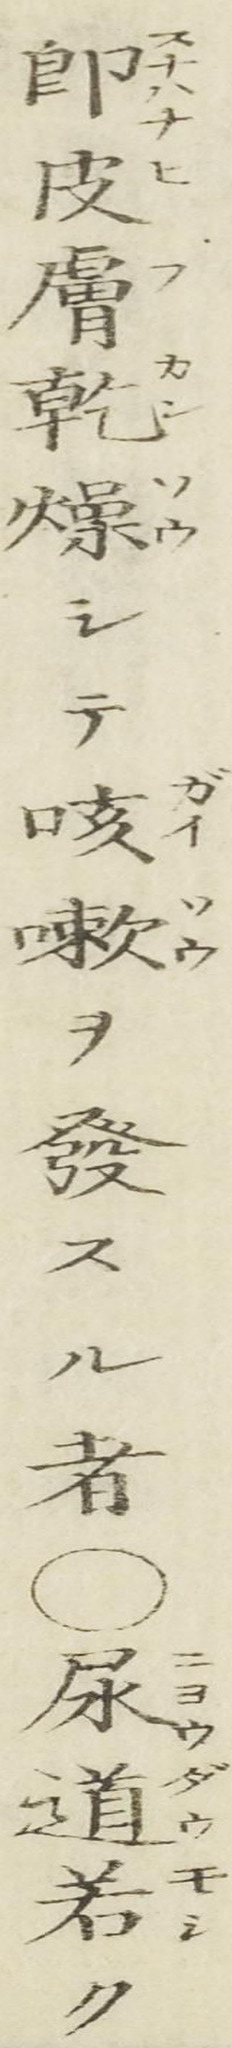即皮膚乾燥シテ咳嗽ヲ発スル者○尿道若ク
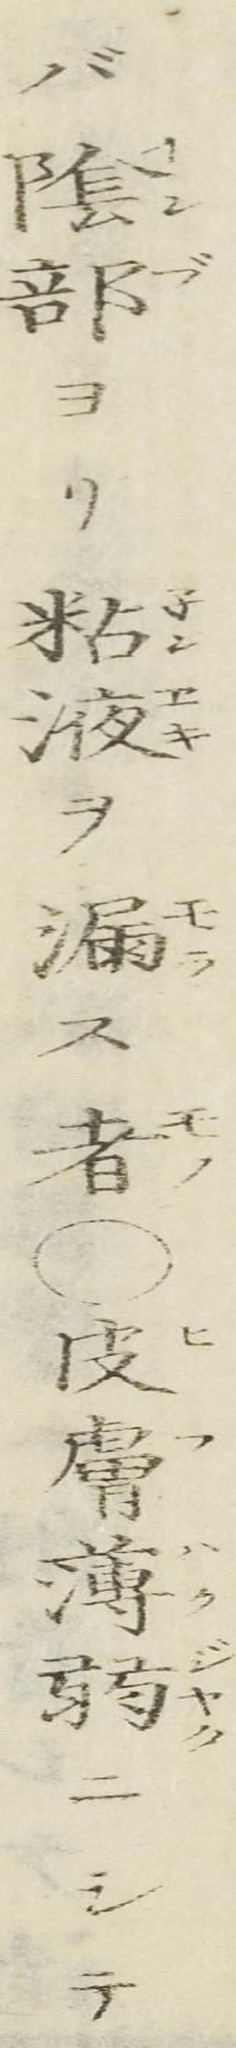バ陰部ヨリ粘液ヲ漏ス者○皮膚薄弱ニシテ
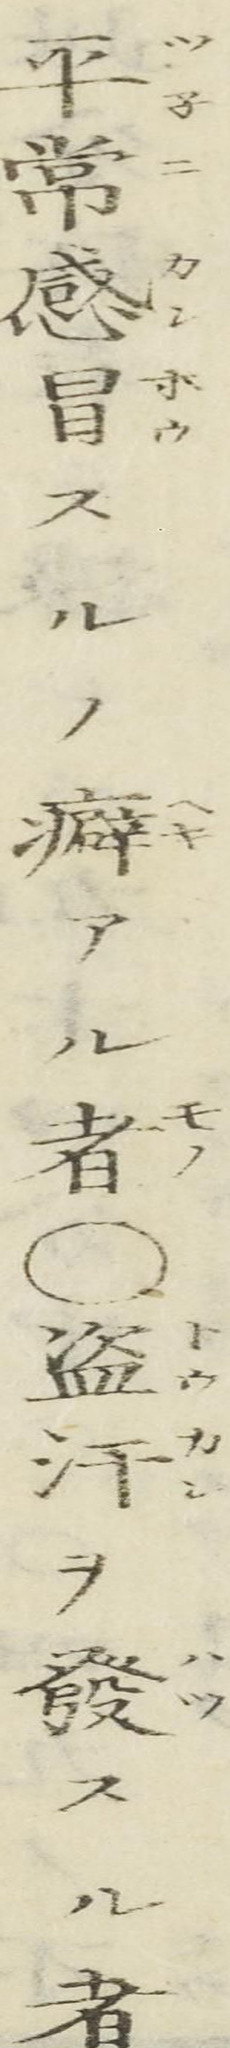平常感冒スルノ癖アル者○盗汗ヲ発スル者
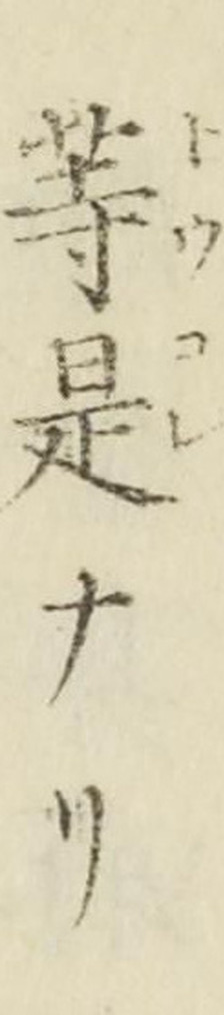等是ナリ
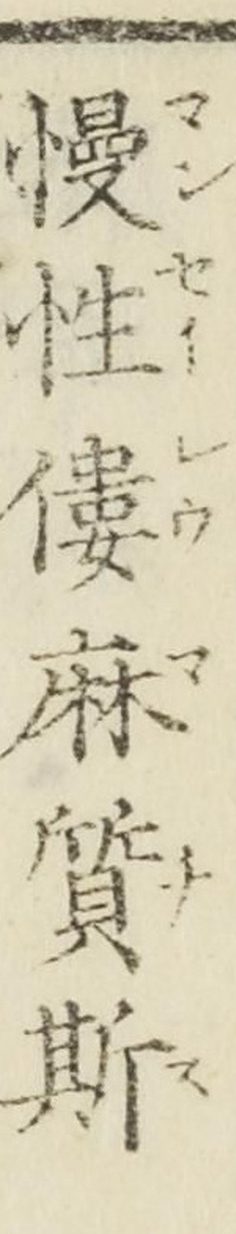慢性僂麻質斯
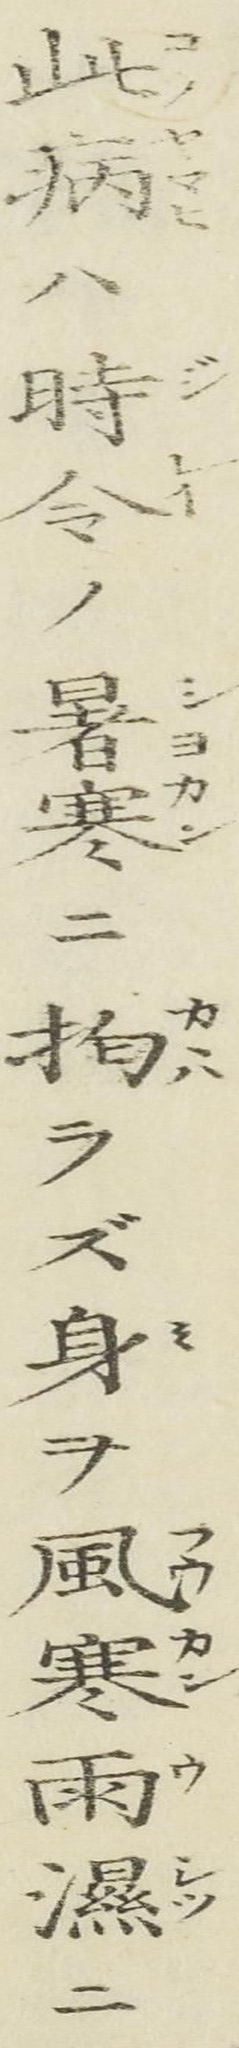此病ハ時令ノ暑寒ニ拘ラズ身ヲ風寒雨湿ニ
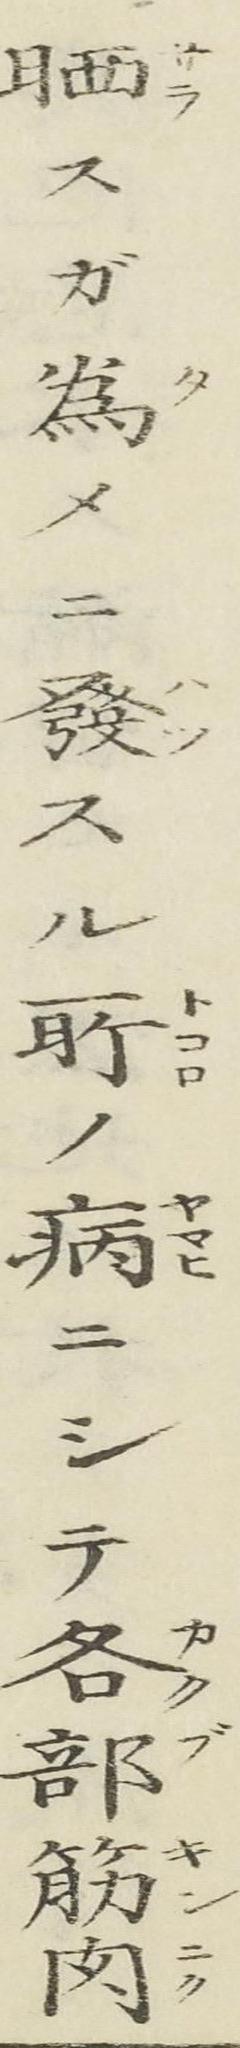晒スガ為メニ発スル所ノ病ニシテ各部筋肉
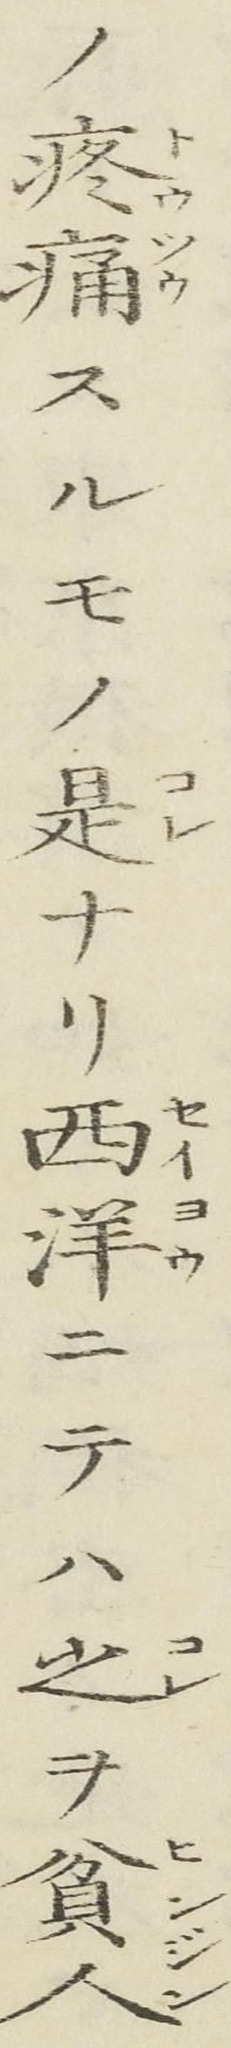ノ疼痛スルモノ是ナリ西洋ニテハ之ヲ貧人
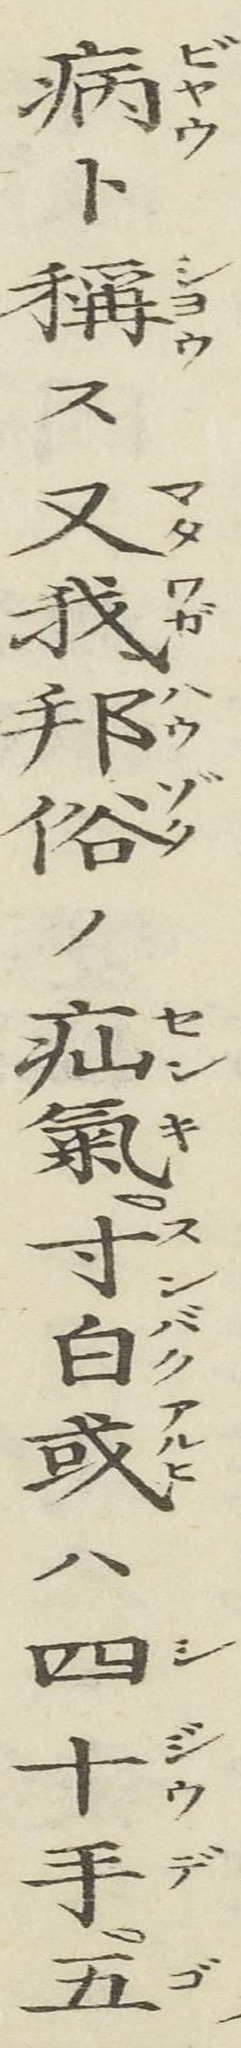病ト称ス又我邦俗ノ疝気、寸白或ハ四十手、五
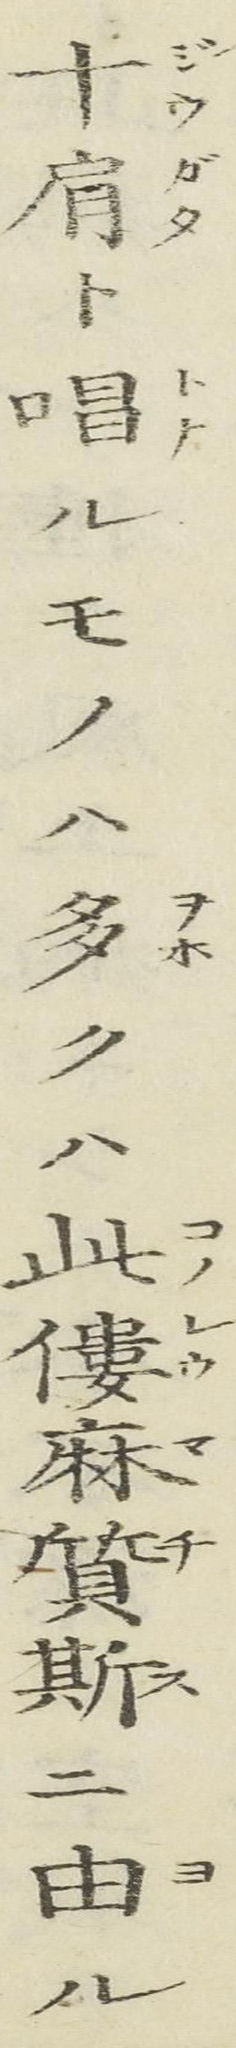十肩ト唱ルモノハ多クハ此僂麻質斯ニ由ル
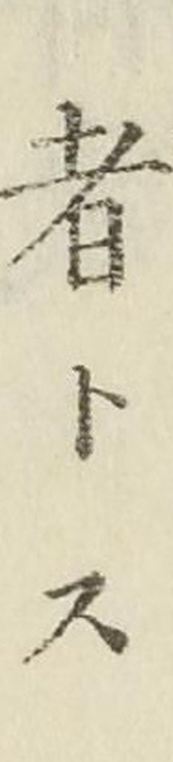者トス
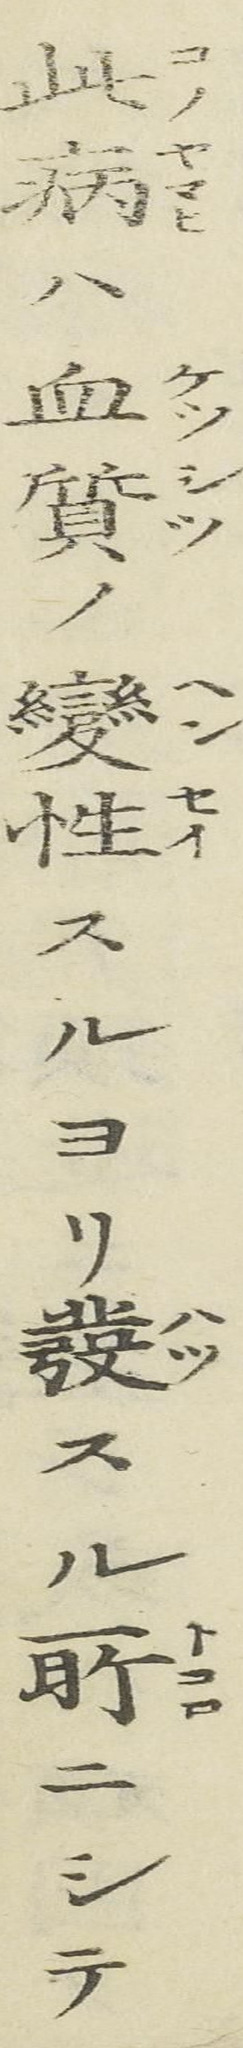此病ハ血質ノ変性スルヨリ発スル所ニシテ

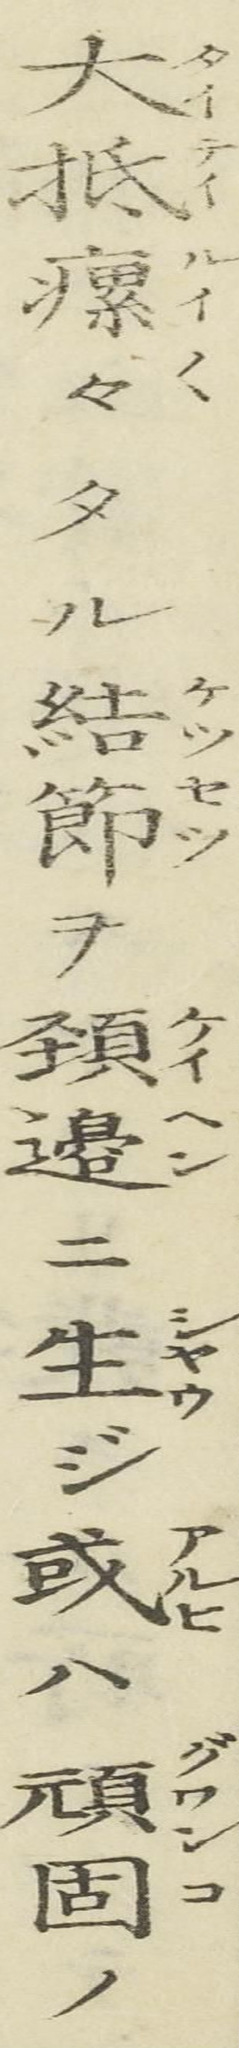大抵瘰々タル結節ヲ頚辺ニ生ジ或ハ頑固ノ
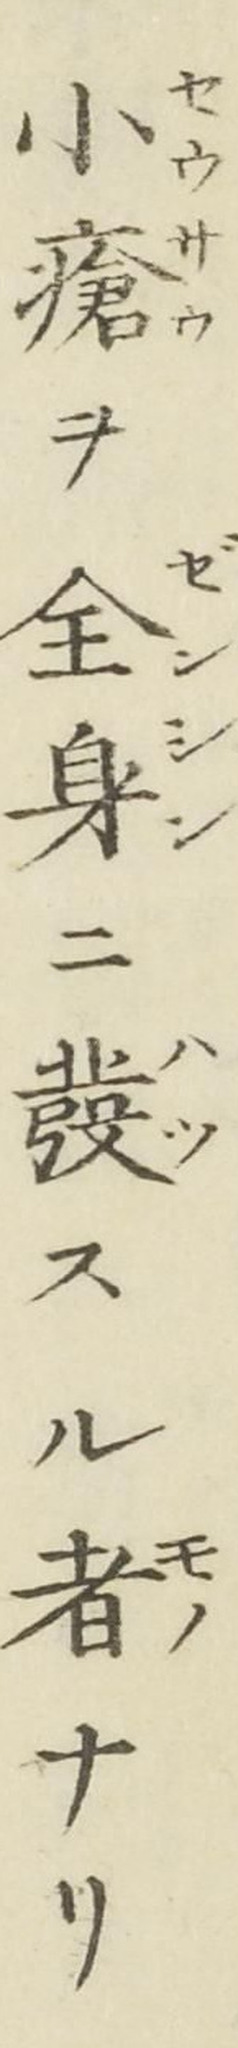小瘡ヲ全身ニ発スル者ナリ
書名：熱海温泉考　全
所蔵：東京大学地震研究所図書室 Earthquake Research Institute Library, The University of Tokyo, JAPAN
